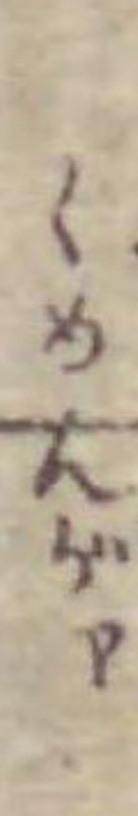くめんがァ
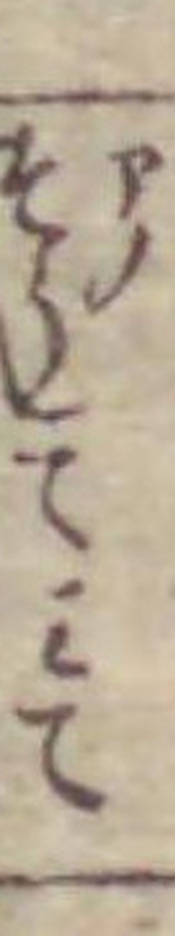そうしてみて
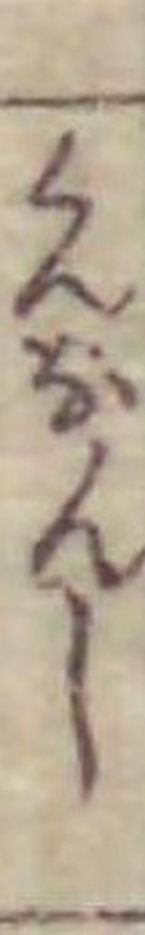くんなんし
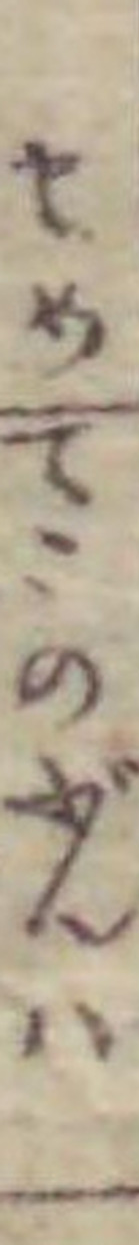せめてこのぶんは
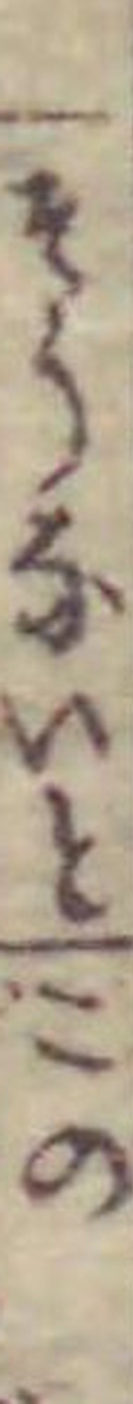そうないとこの
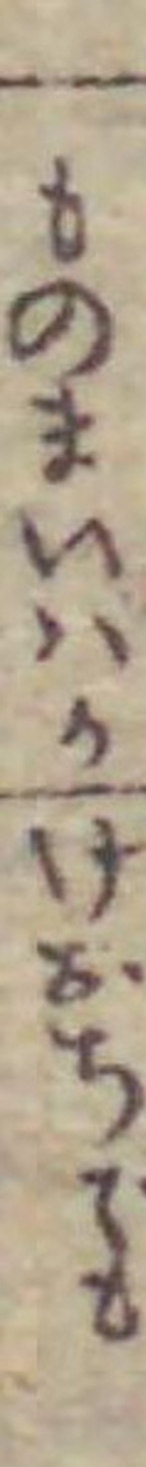ものまいはかけおちでも
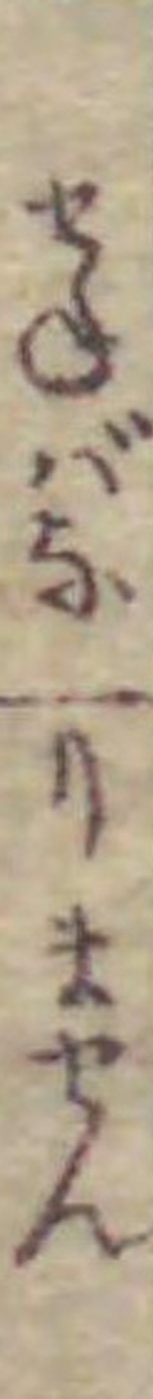せねばなりません

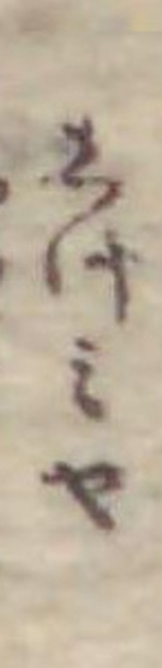しけみや
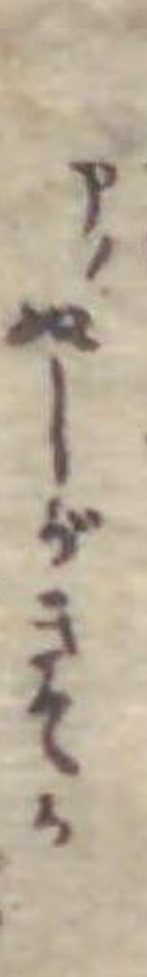アノぬしがきてか
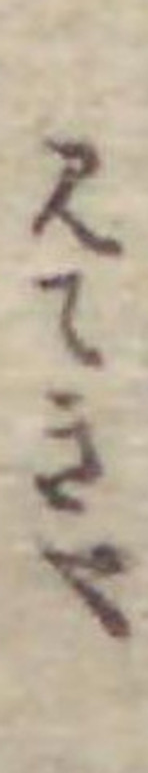見てきや
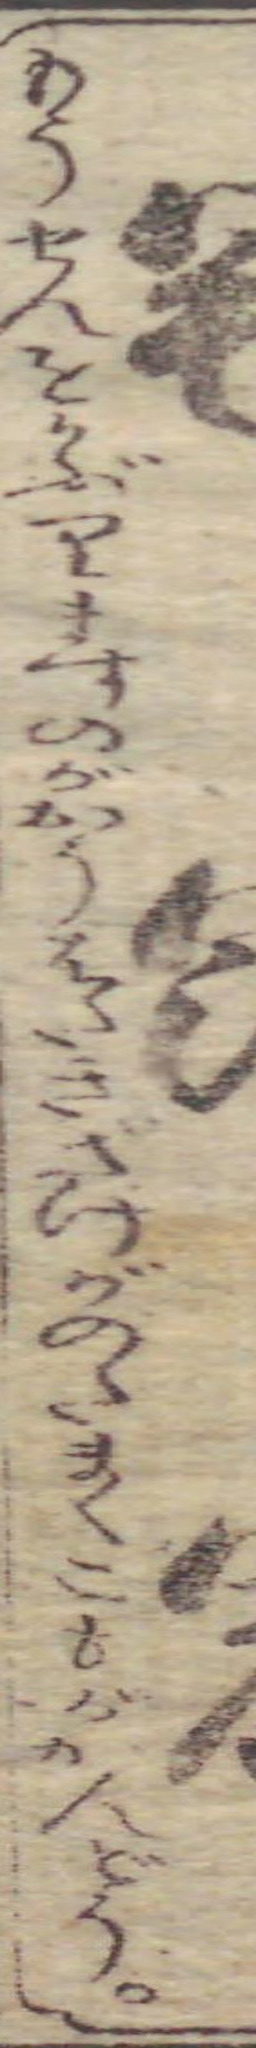もうせんをかぶりますのがおうはたき。さけがのたまく。こもがかんどう。

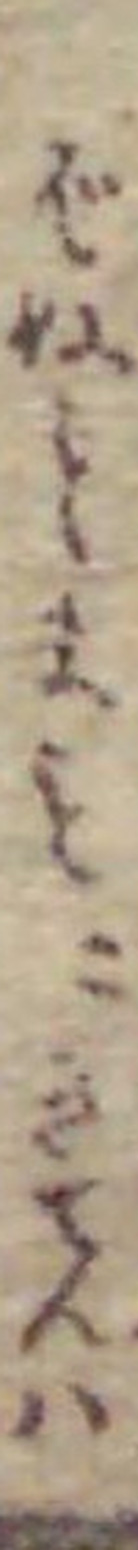ばぬことまことにきてんは
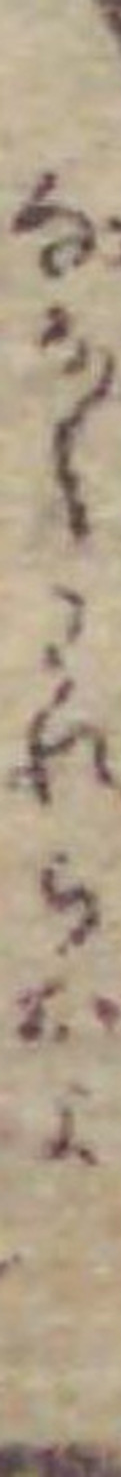なか〳〵われらおよ
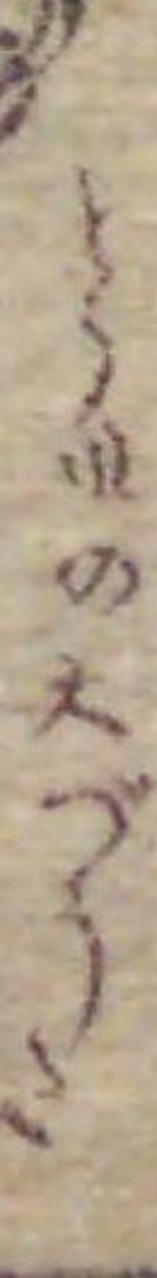とう世の大づうた
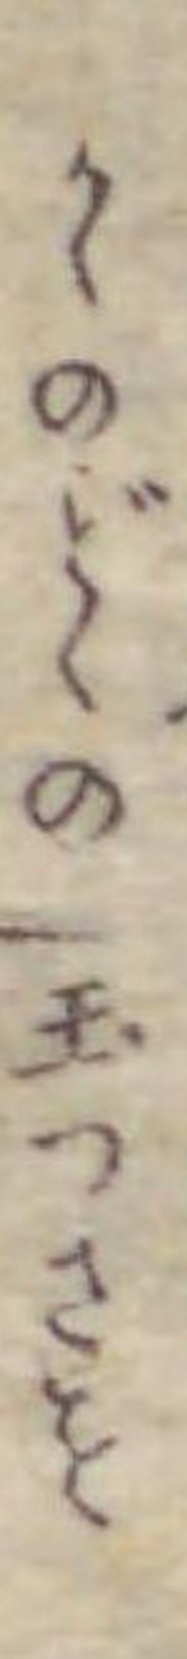かくのごとくの玉つさを
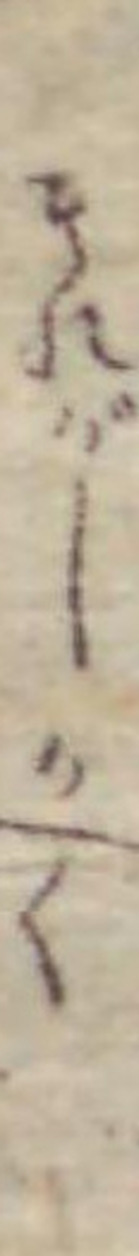それがしかく
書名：郭𦽳費字尽 : 3巻
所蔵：国立国会図書館 National Diet Library, JAPAN
